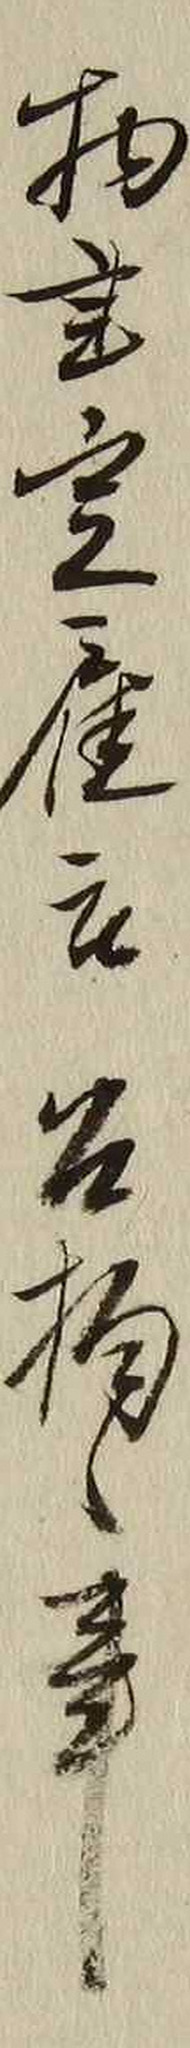物書定雇被召抱候事
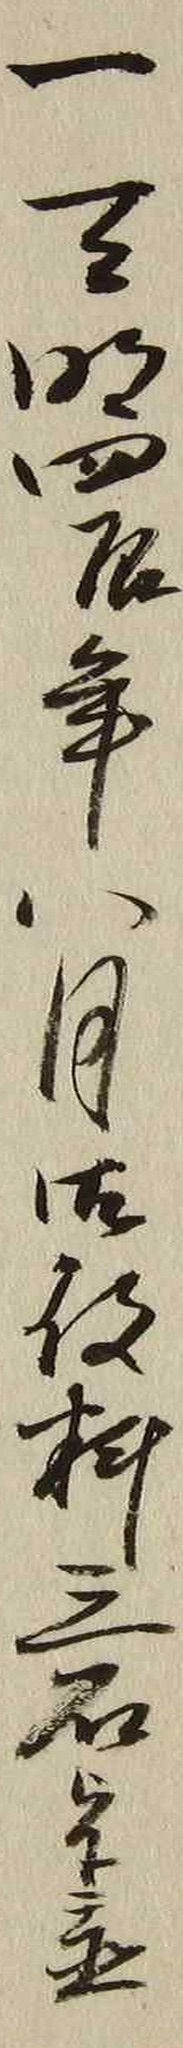一天明四辰年八月御役料三石被下置
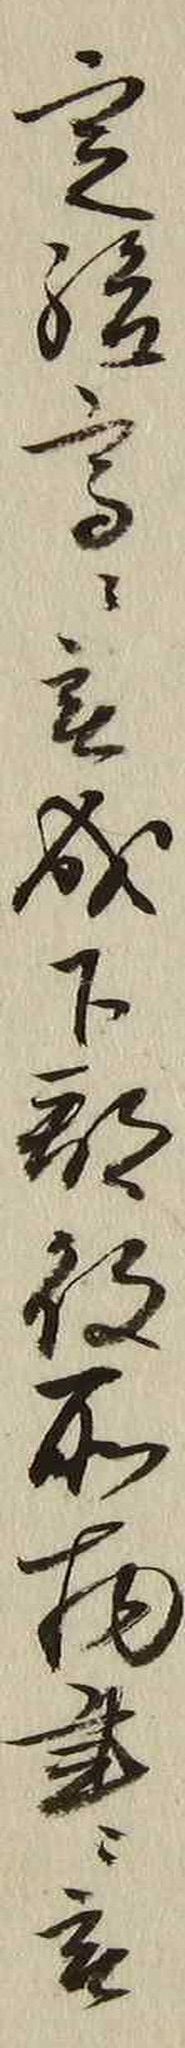定給高ニ被成下郡役所物書ニ被
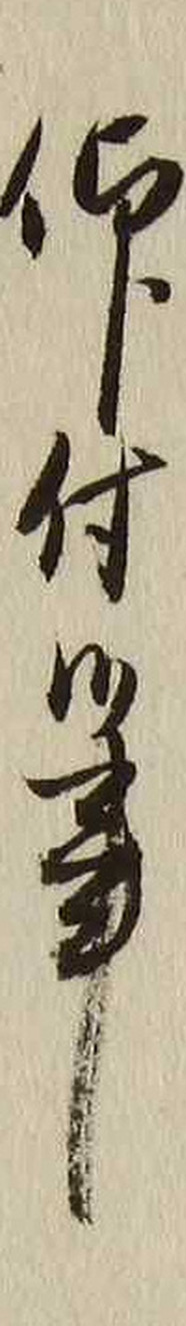仰付候事
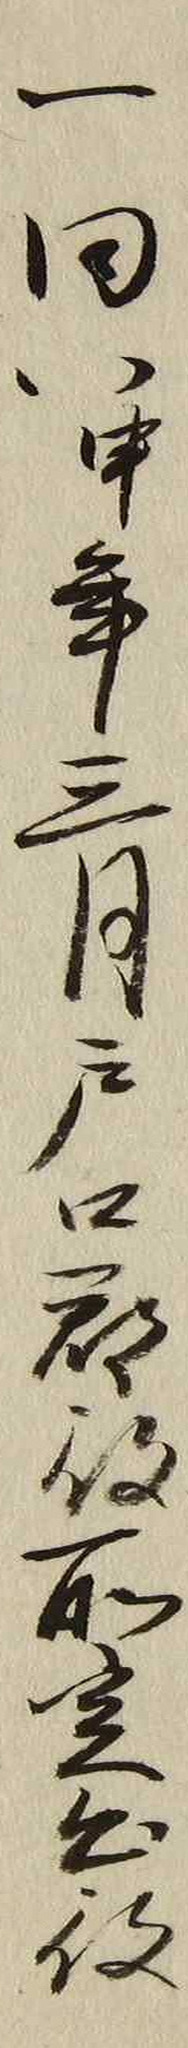一同八申年三月戸口郡役所定出役
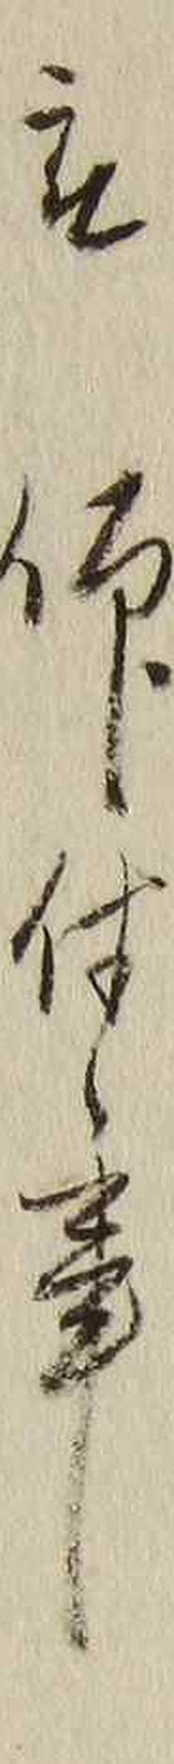被仰付候事
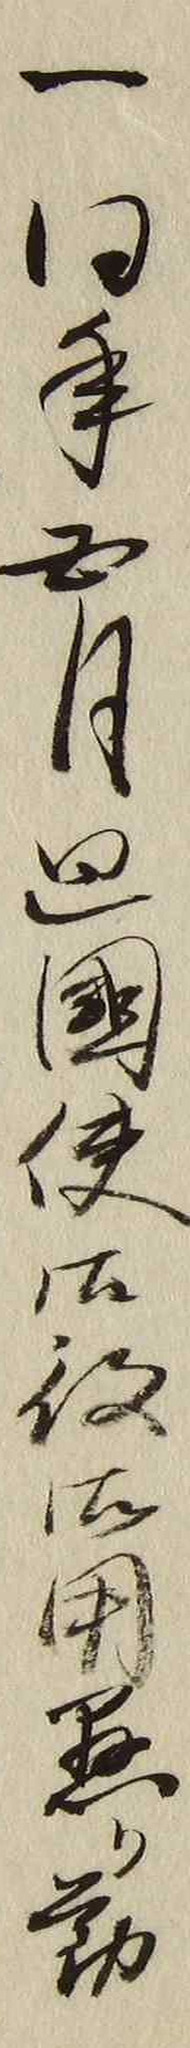一同年五月廻国使御役御用懸り勤
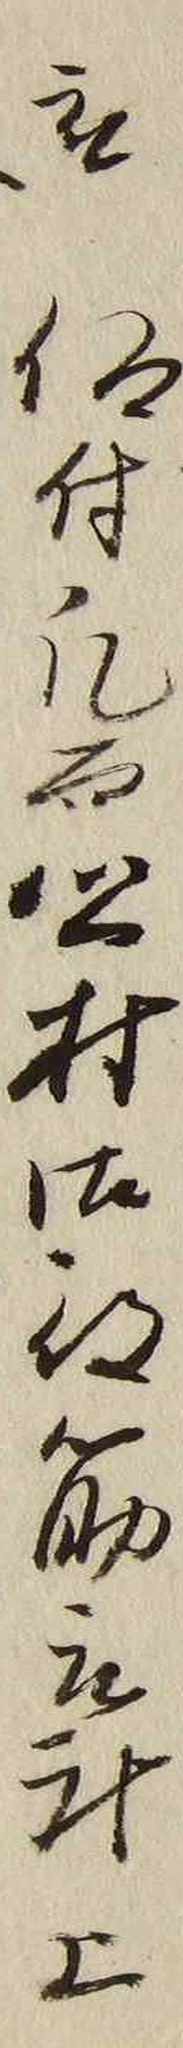被仰付凡而郷村御役筋取計上
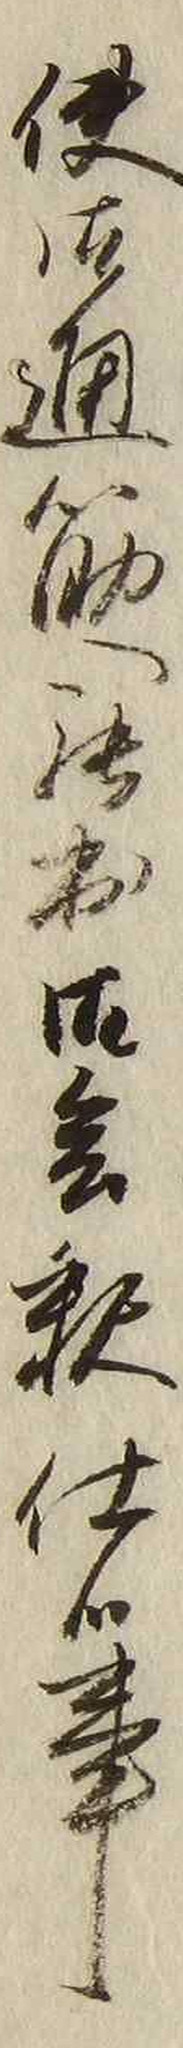使御通筋へ罷出御会釈仕候事

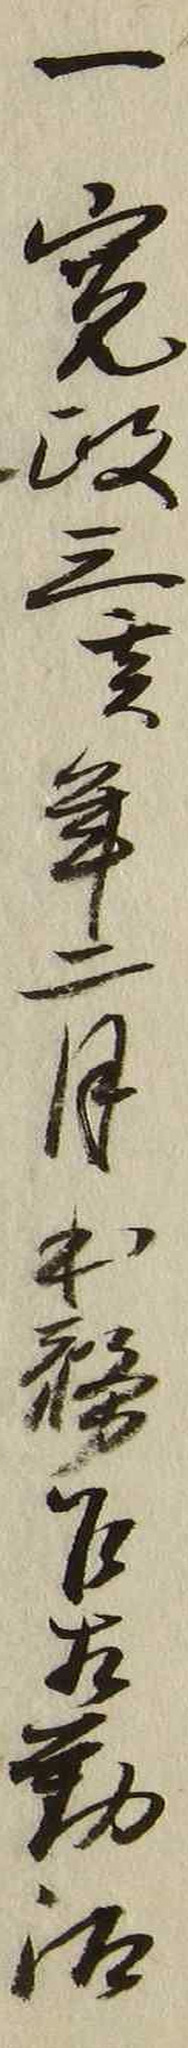一寛政三亥年二月本務乍相勤沼
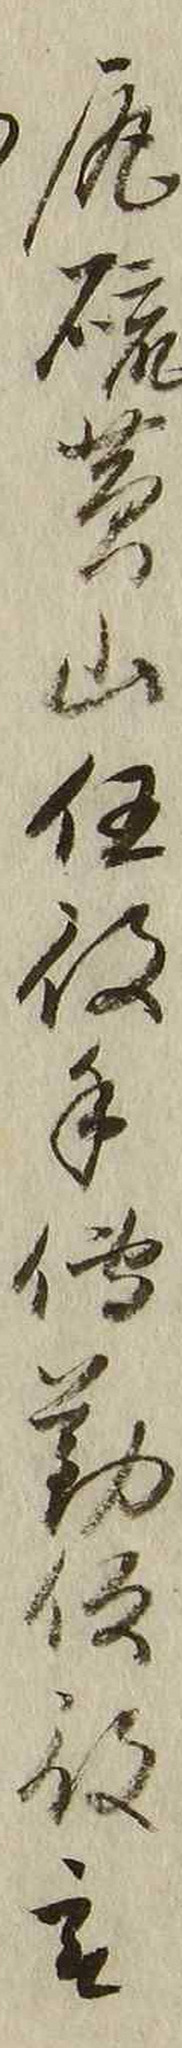尻硫黄山任役手伝勤仮役被
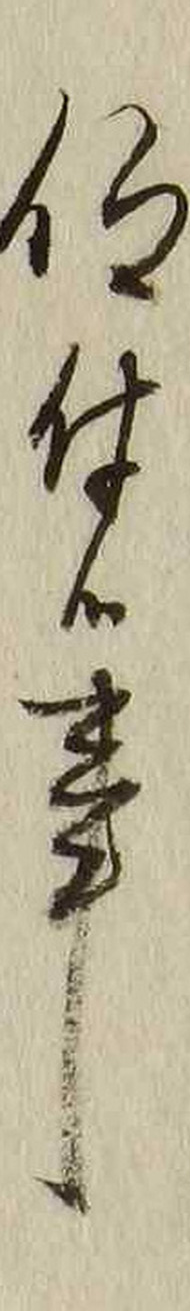仰付候事
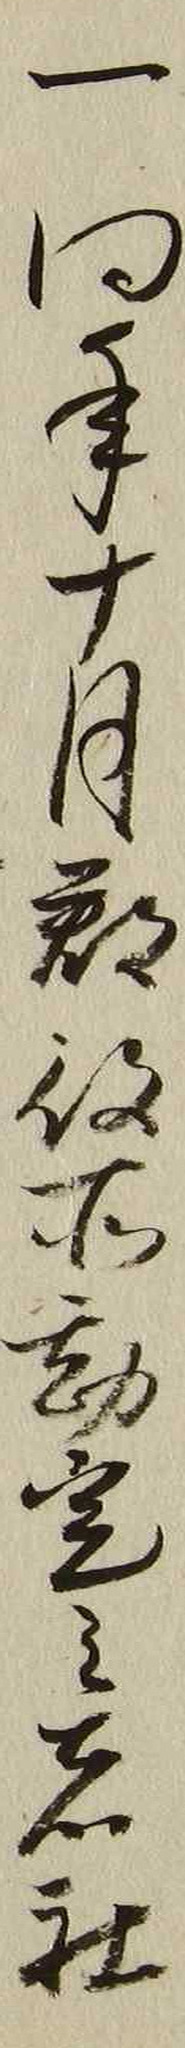一同年十月郡役所勘定之者社
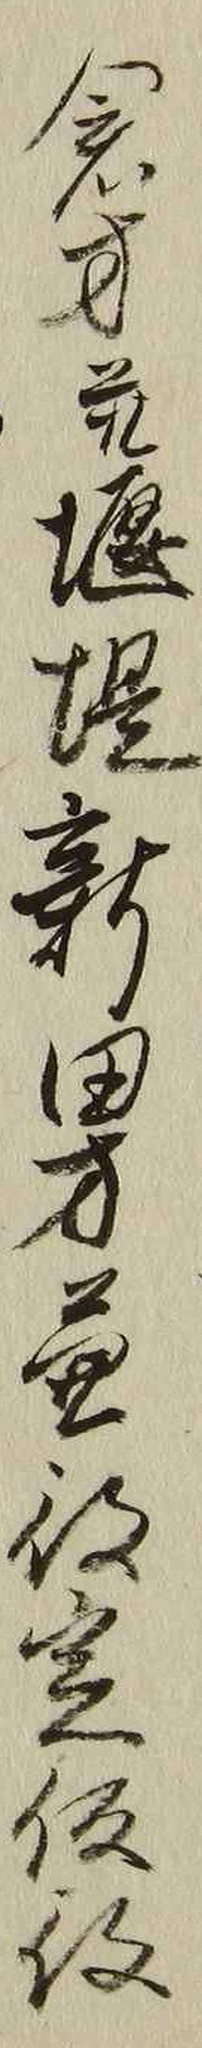倉方并堰堤新田方兼役定仮役
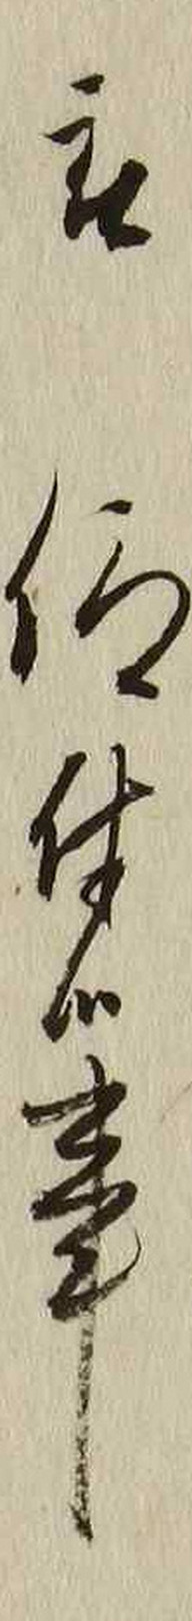被仰付候事
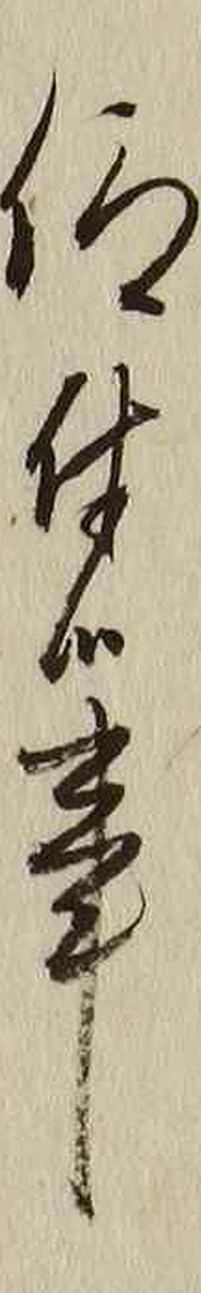仰付候事
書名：諸士系譜　巻之352　す之部2
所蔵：会津若松市立会津図書館
